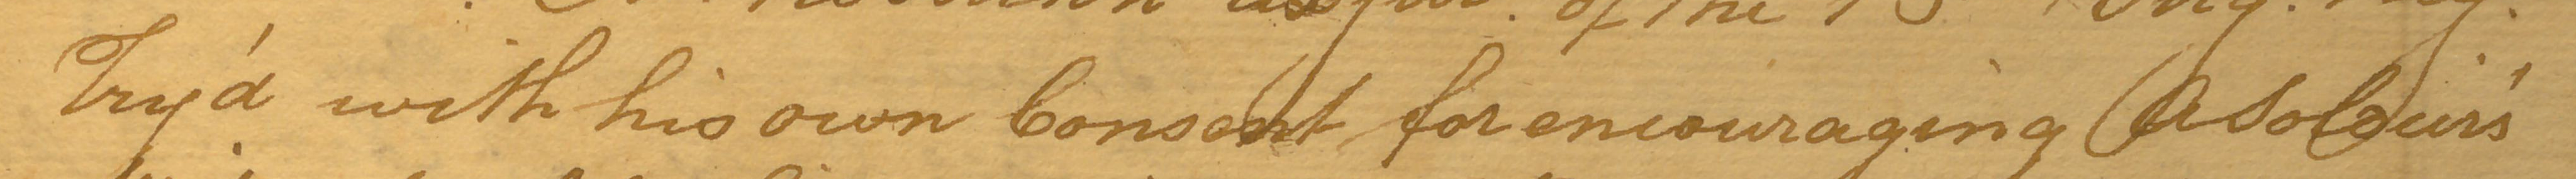Try'd with his own Consent for encouraging A Soldier's
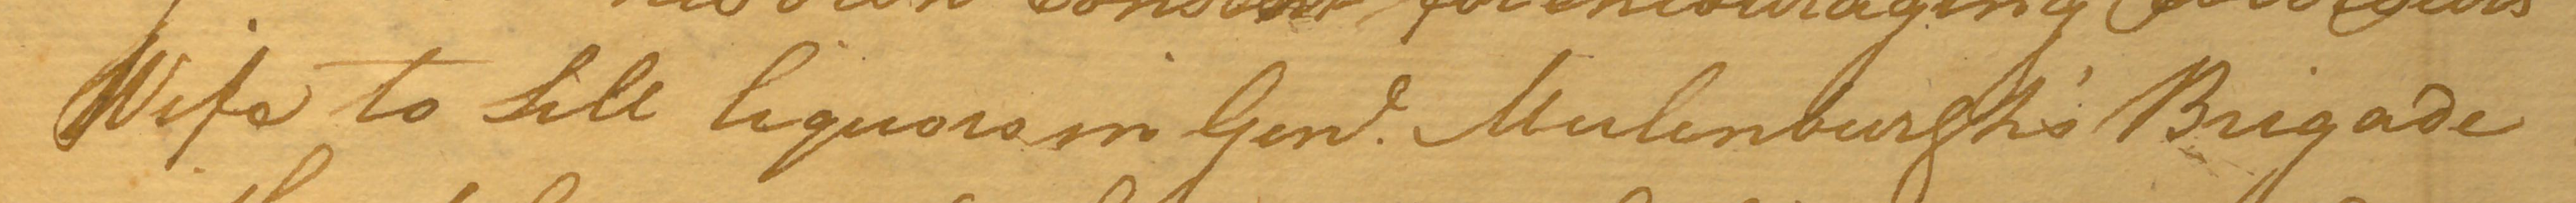Wife to sell liquors in Gen^l. Muhlenburgh's Brigade
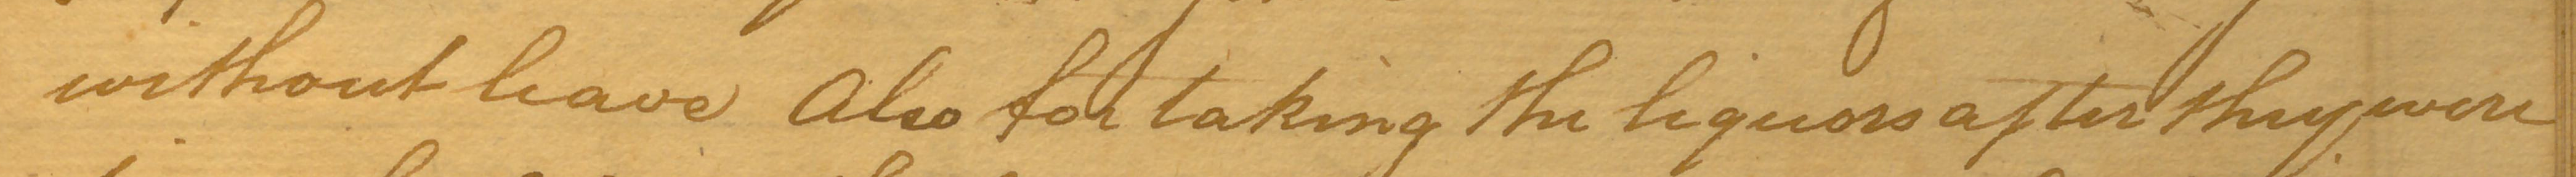without leave Also for taking the liquors after they were
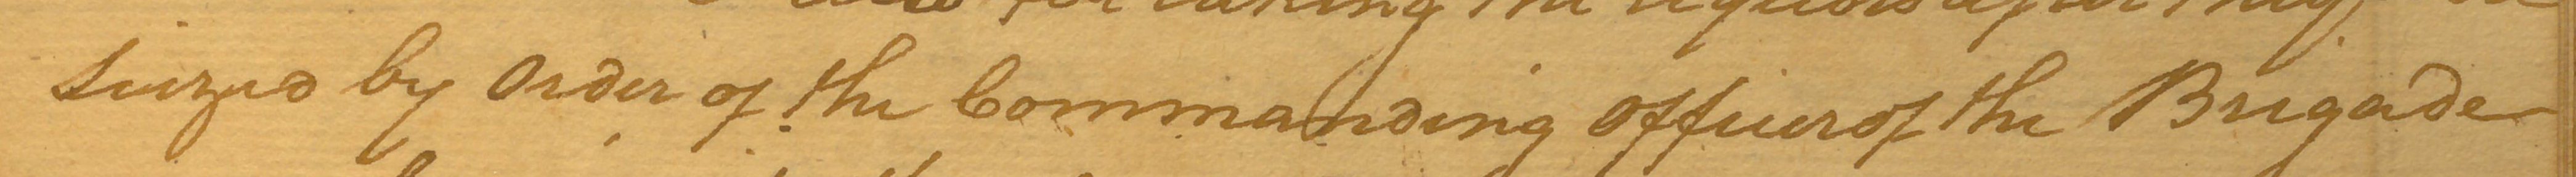Seized by order of the Commanding officer of the Brigade
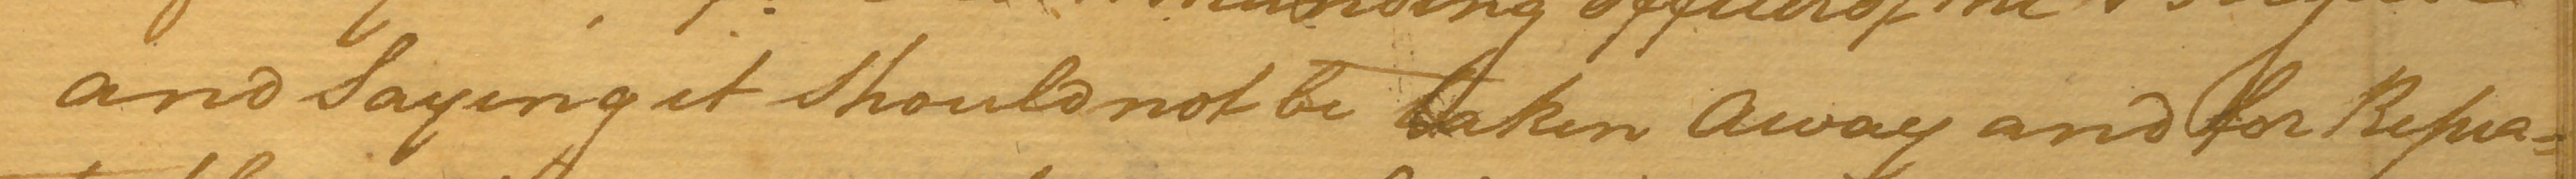and Saying it should not be taken away and for Repea-
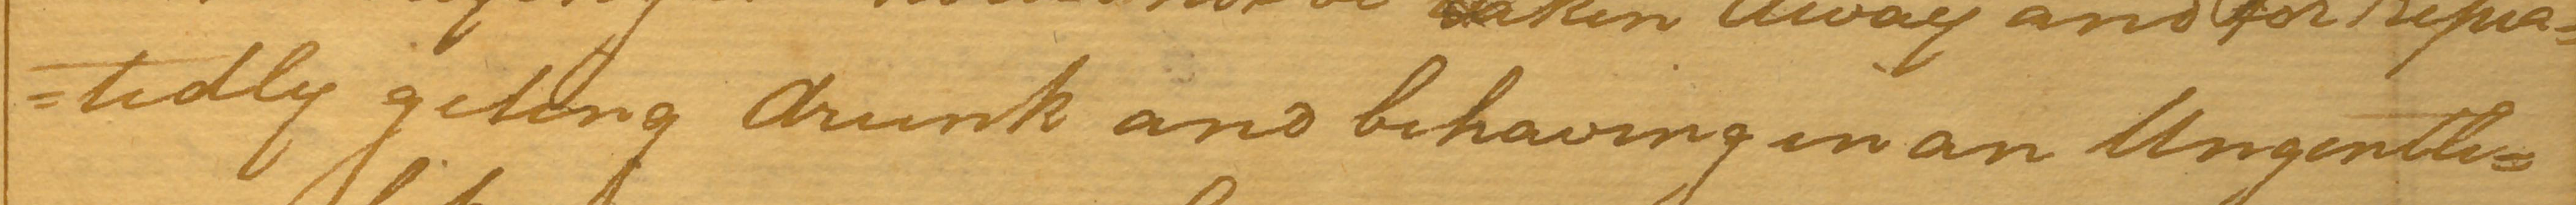-tedly getting drunk and behaving in an Ungentle-
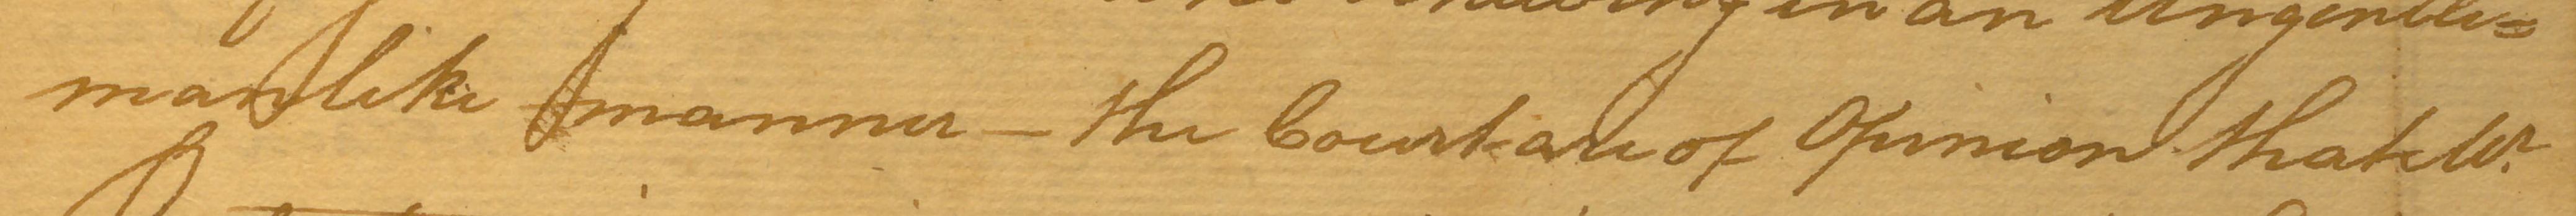manlike manner- the Court are of opinion that M^r.
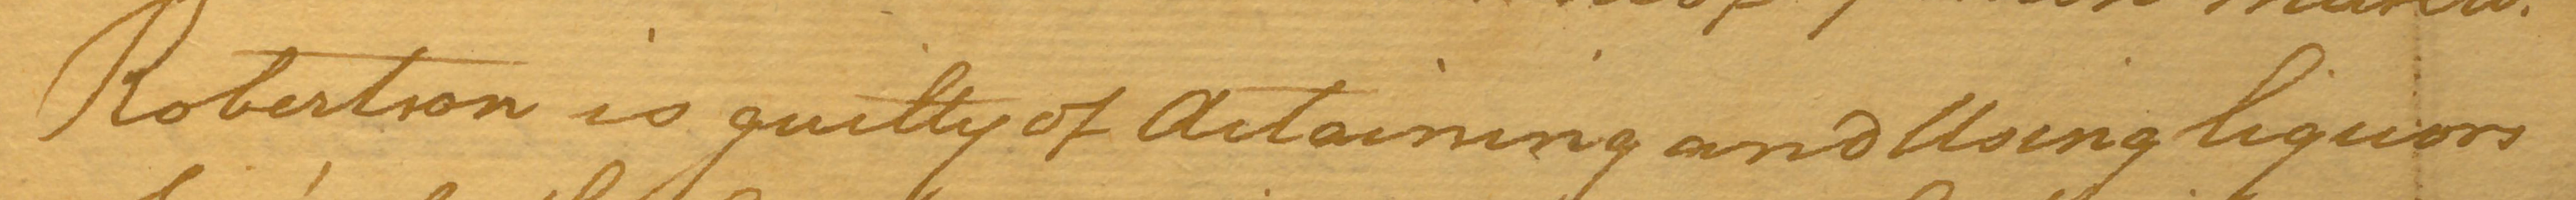Robertson is guilty of detaining and using liquors
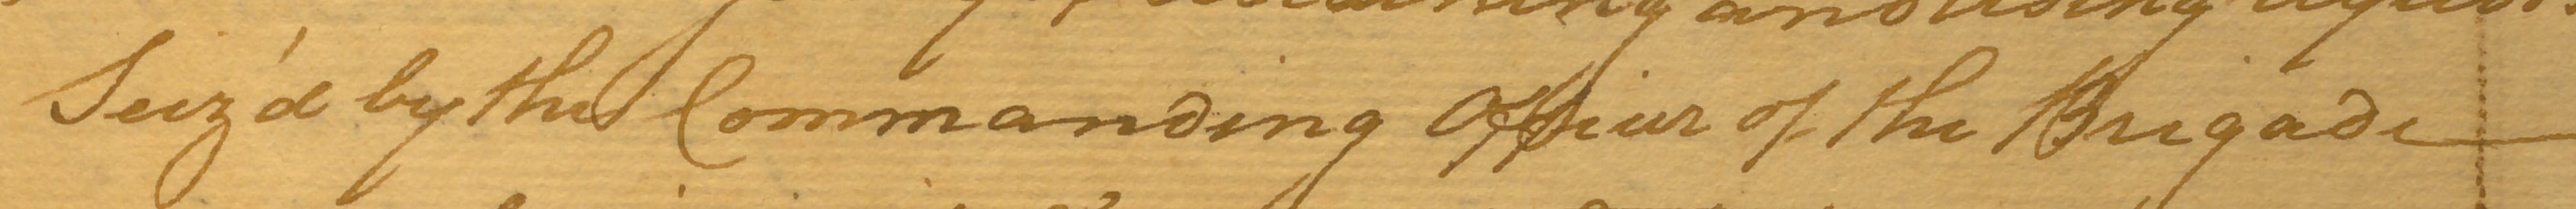Seiz'd by the Commanding officer of the Brigade
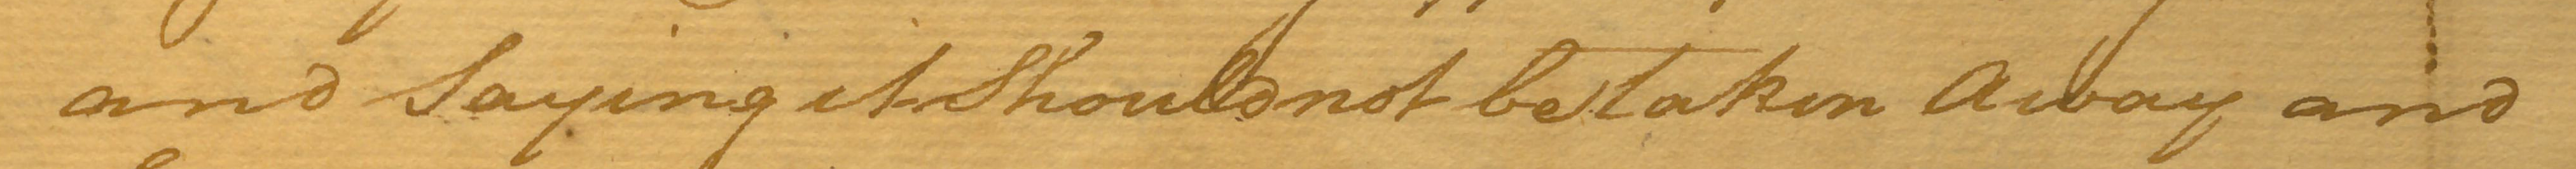and Saying it Should not be taken away and
